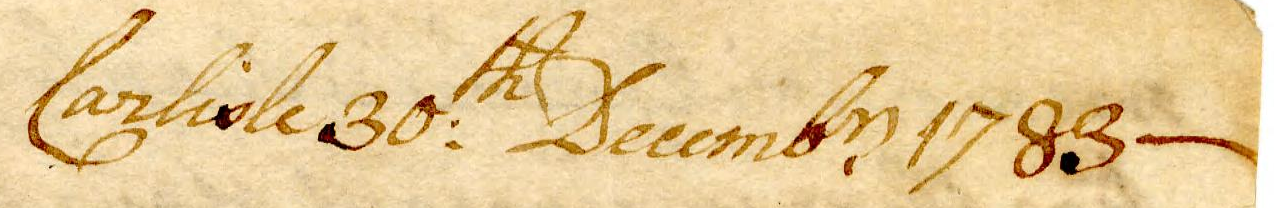Carlisle 30^th. Decemb^r. 1783-
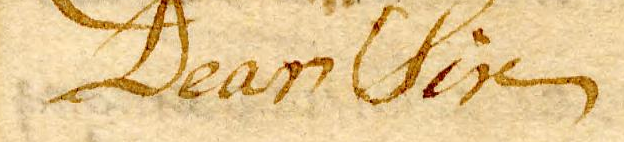Dear Sir
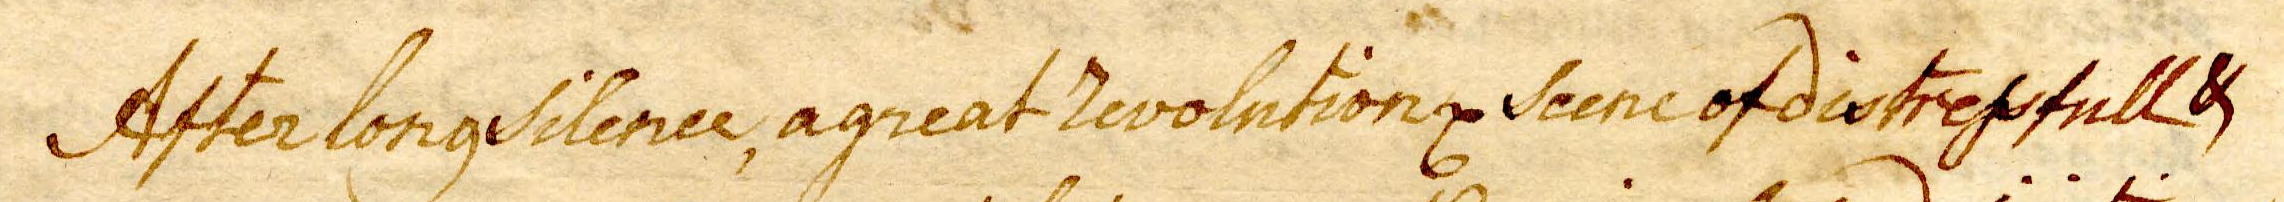After long Silence, a great revolution & scene of distressfull &
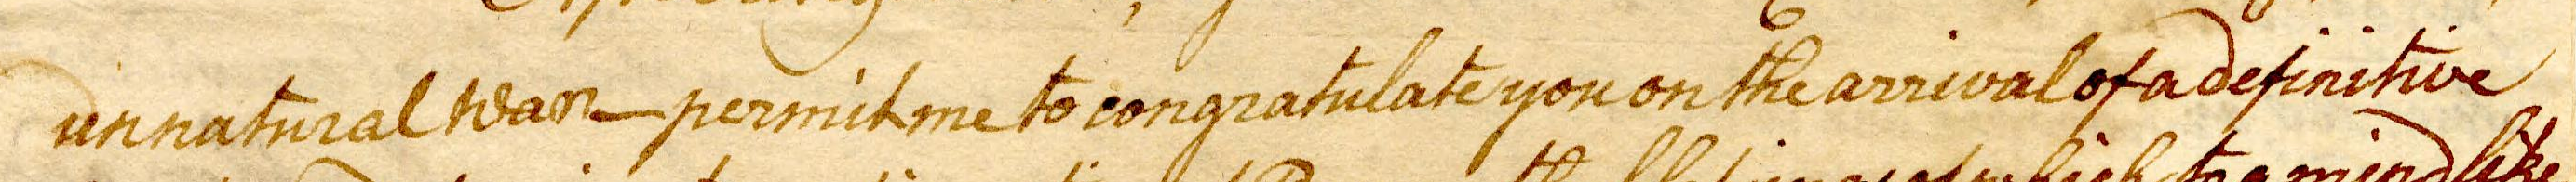unnatural War permit me to congratulate you on the arrival of a definitive
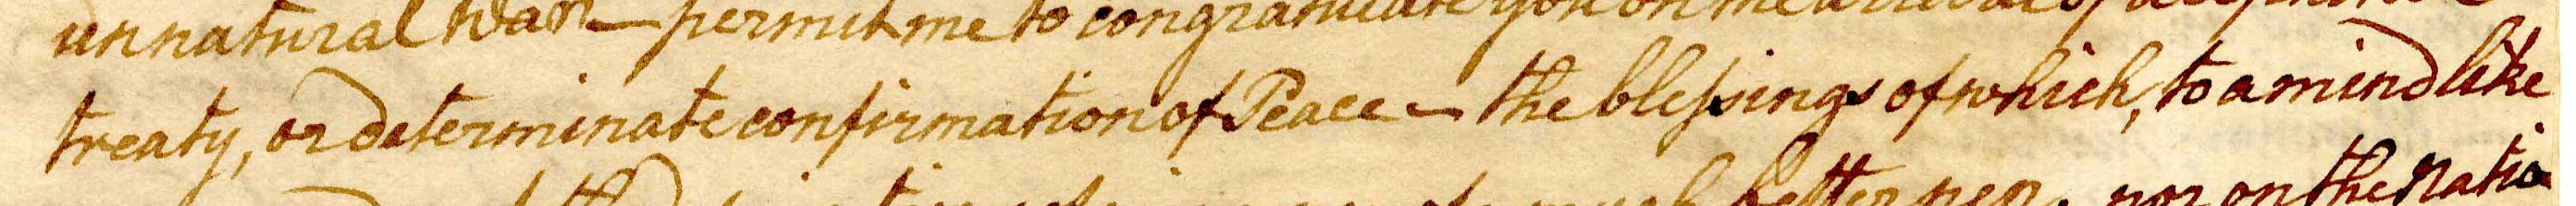treaty, or determinate confirmation of Peace- the blessings of which, to a mind like
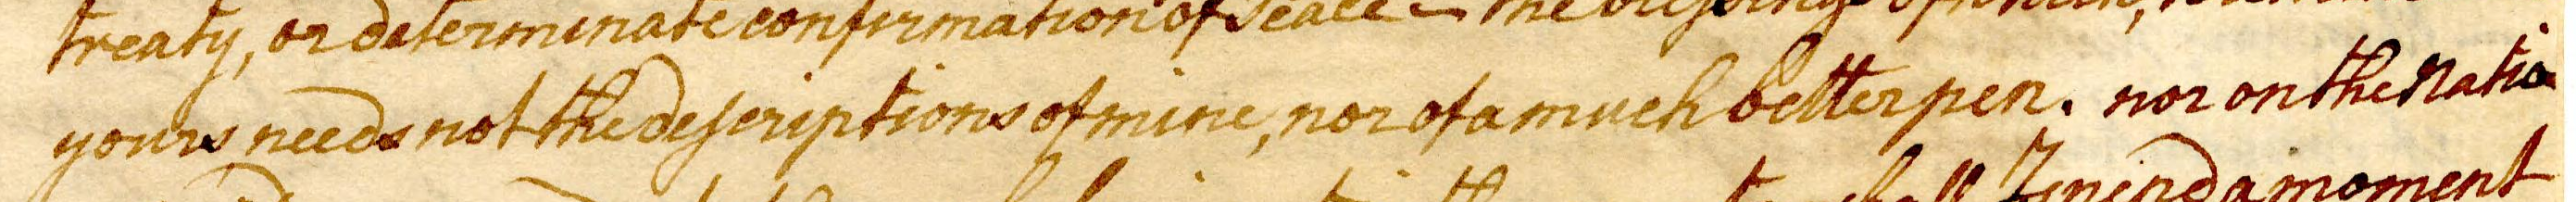yours, needs not the descriptions of mine, nor of a much better pen, nor on the natio
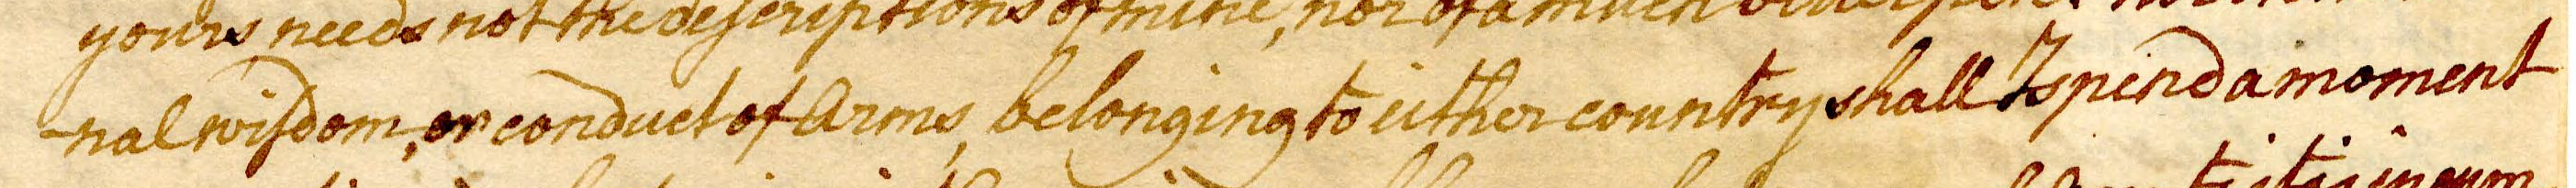-nal wisdom, or conduct of Arms, belonging to either country shall I spend a moment
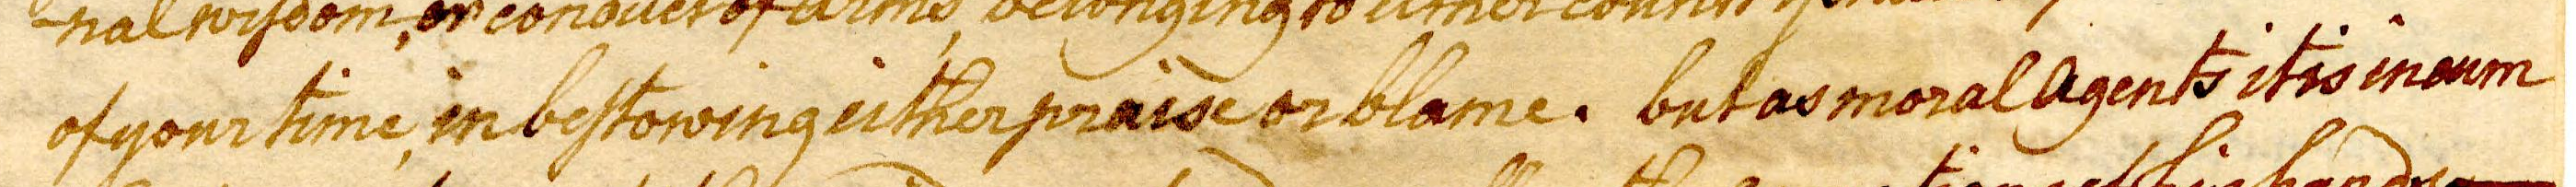of your time, in bestowing either praise or blame. but as moral agents it is incum
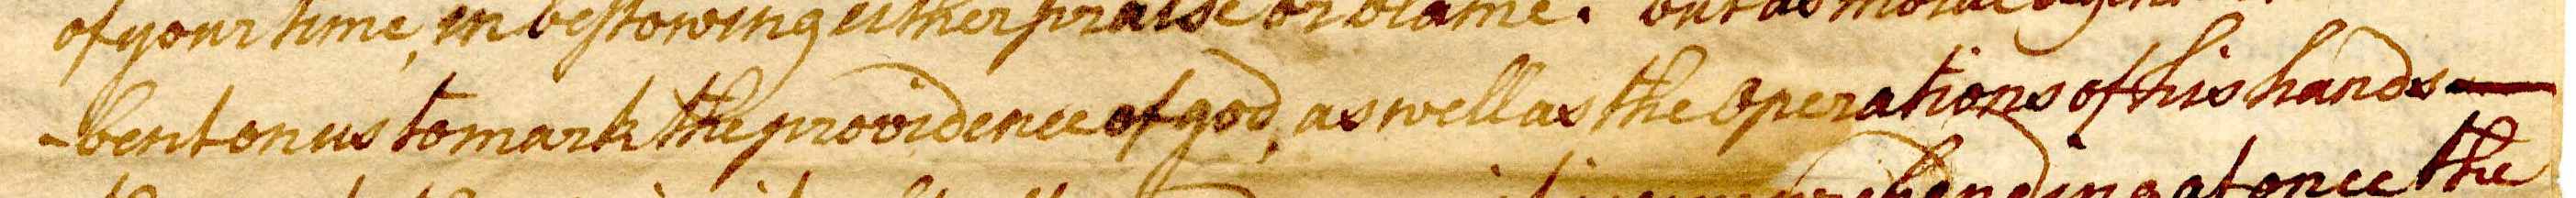-bent on us to mark the providence of god, as well as the operations of his hands-
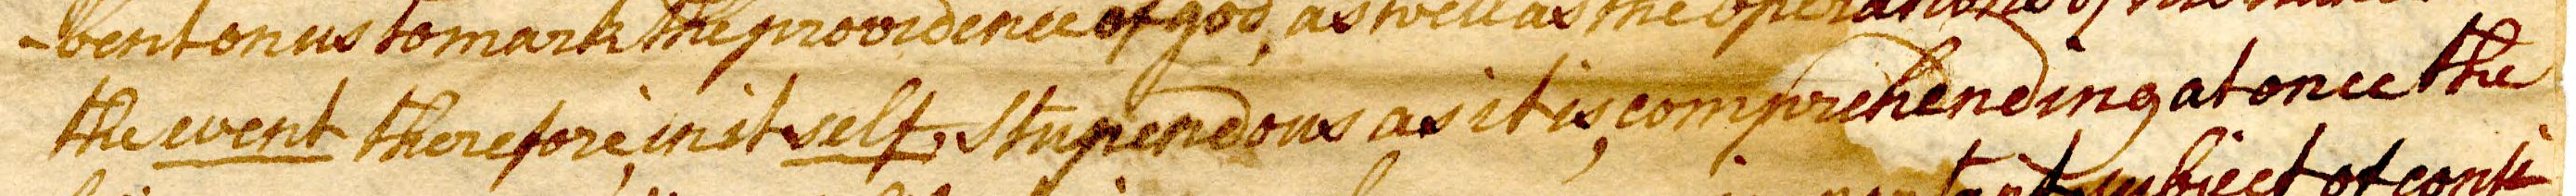the event therefore, in itself, Stupendous as it is, comprehending at once the
